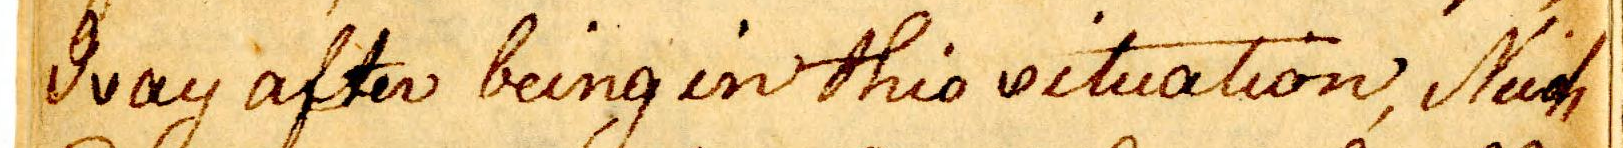I say after being in this situation, Neigh
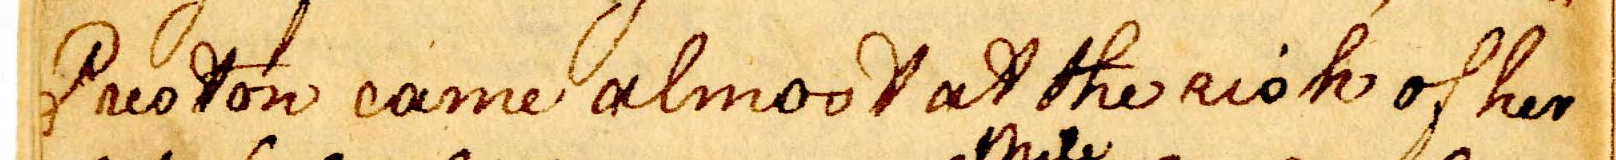Preston came almost at the risk of her
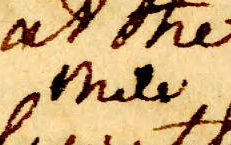Mile
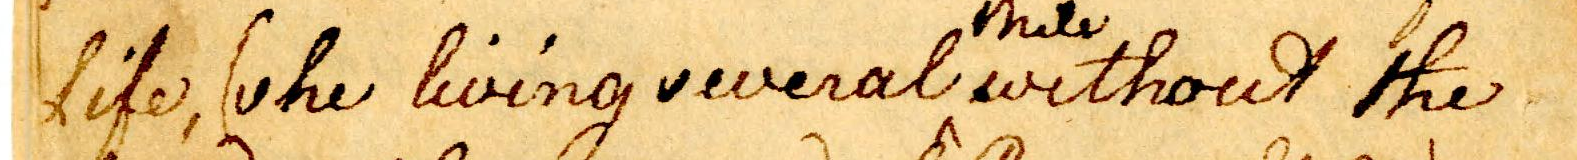Life, (she living several without the
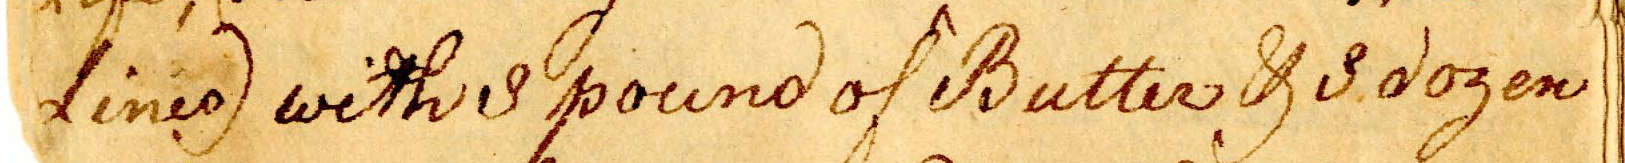Lines) with 3 pound of Butters & 3 dozen
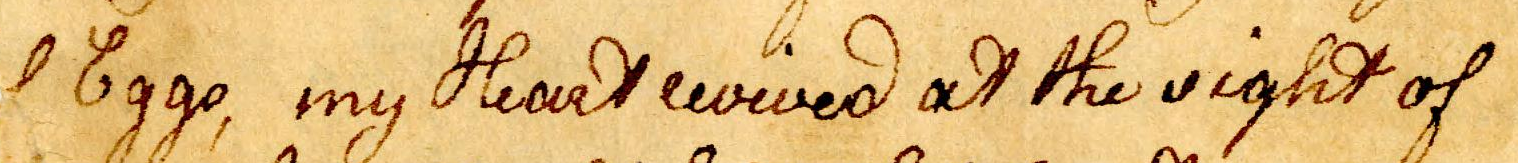Eggs, my Heart revived at the sight of
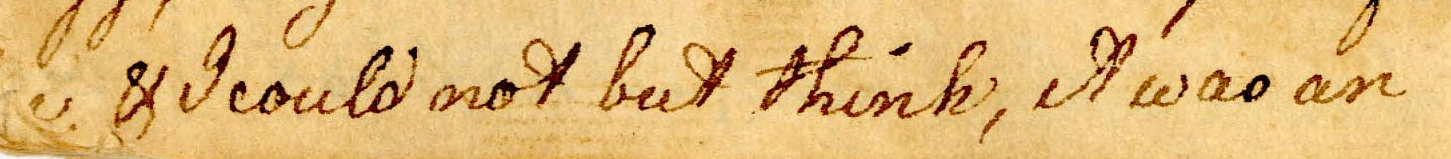[__] & I could not but think, it was an
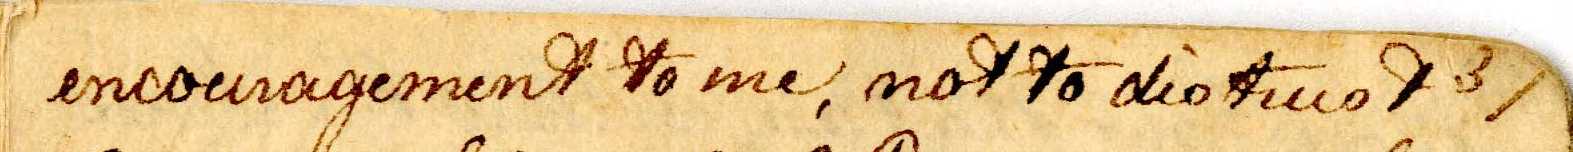encouragement to me, not to distrust 37
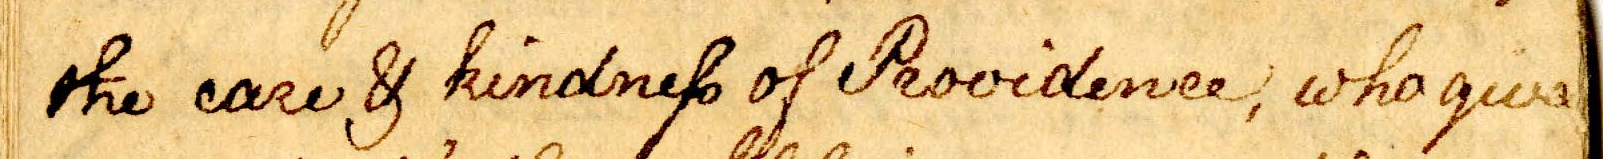the care & kindness of Providence, who give
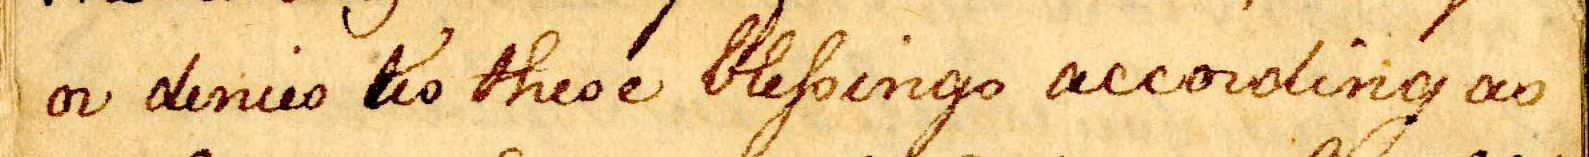or denies tis these blessings according as
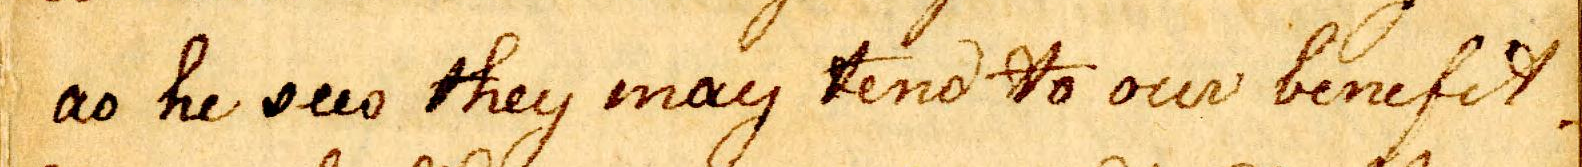as he sees they may tend to our benefit.
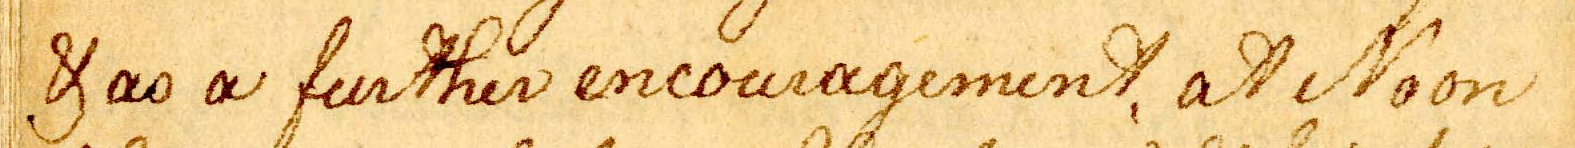& as a further encouragement at Noon
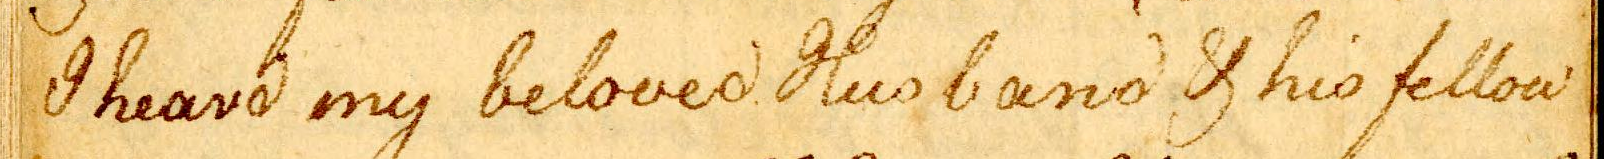I heard my beloved Husband & his fellow
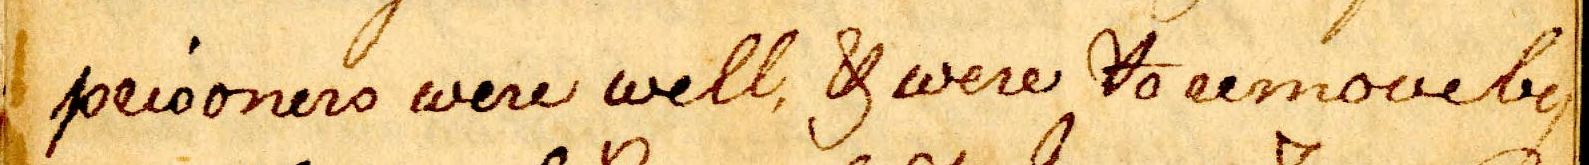peisoners were well, & were to remove by
